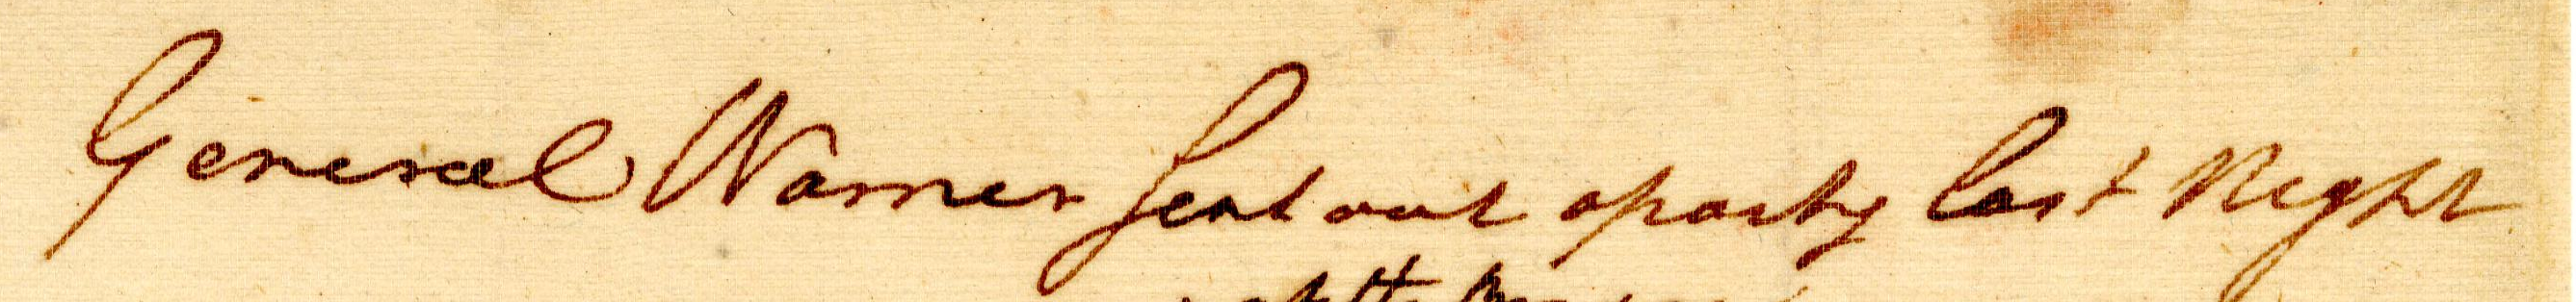General Warner sent out a party last night
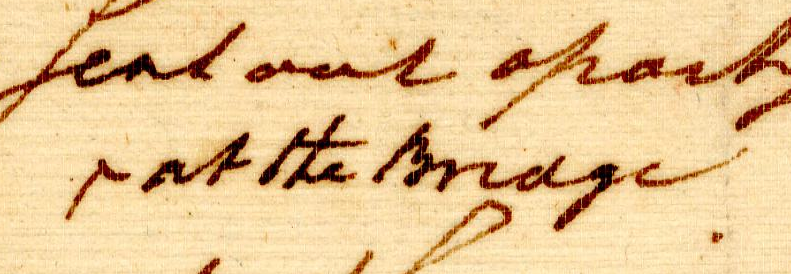^ at the Bridge
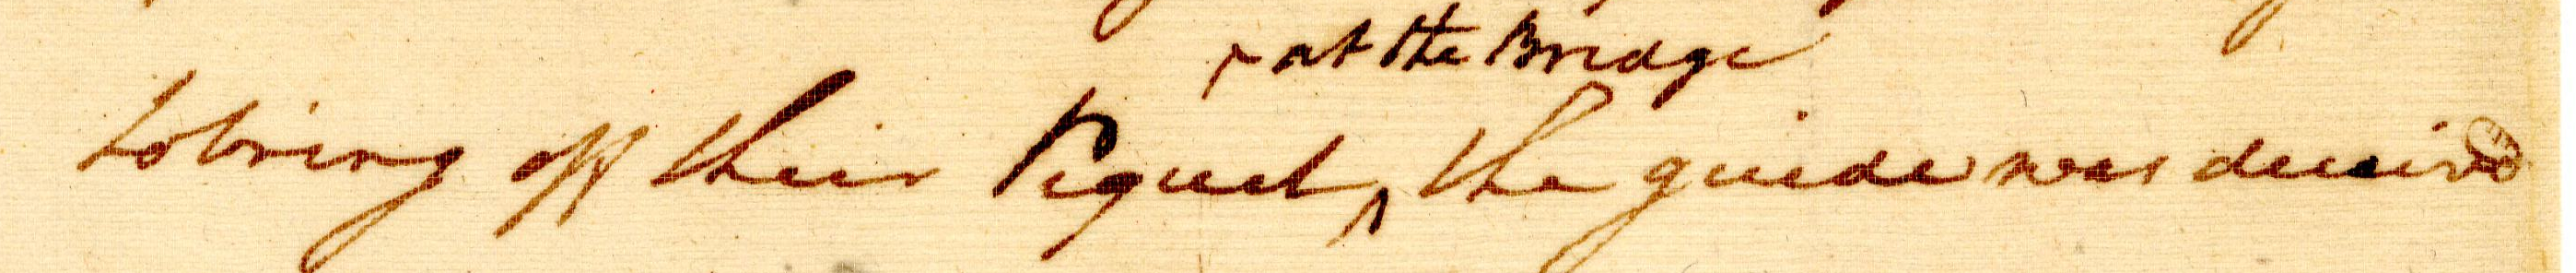to bring off their piquet ^ the guide was deceivd
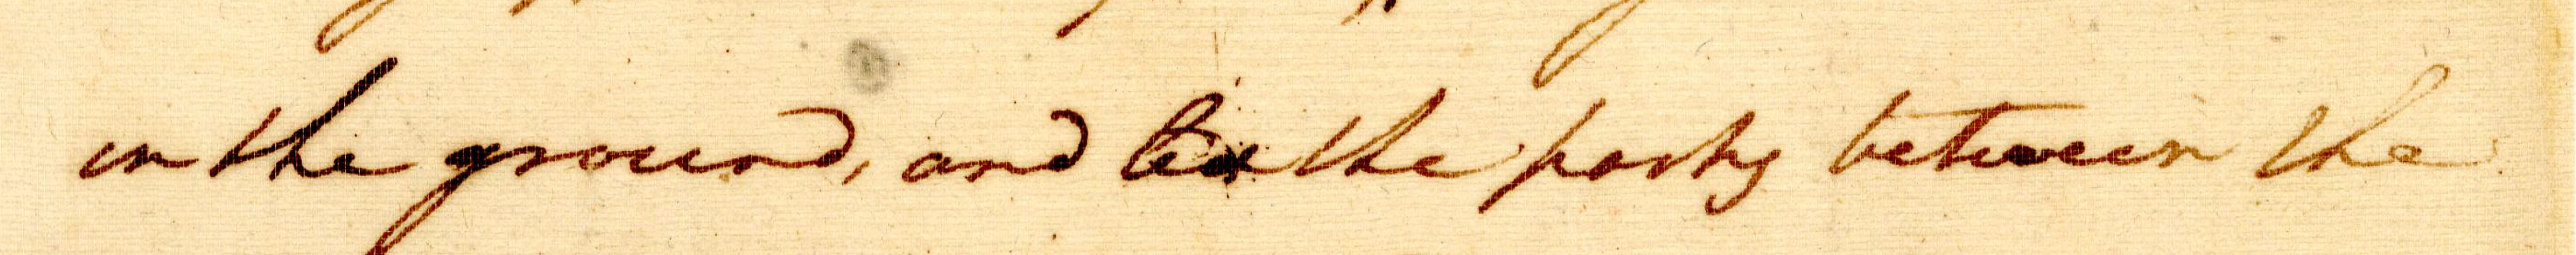in the ground, and led the party between the
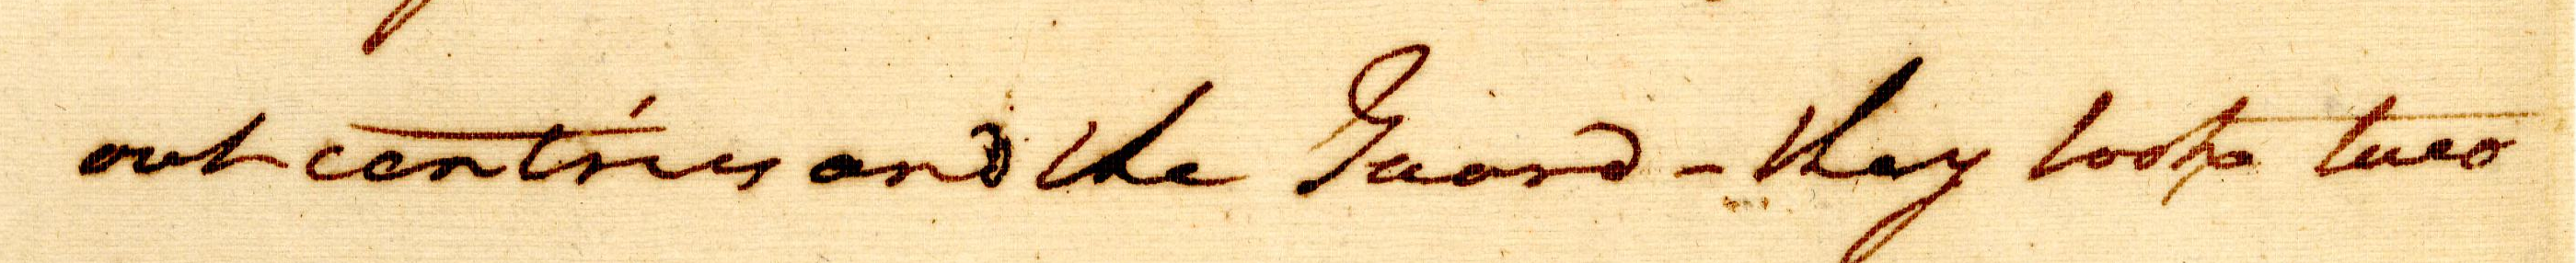out centries and the Guard- they took two
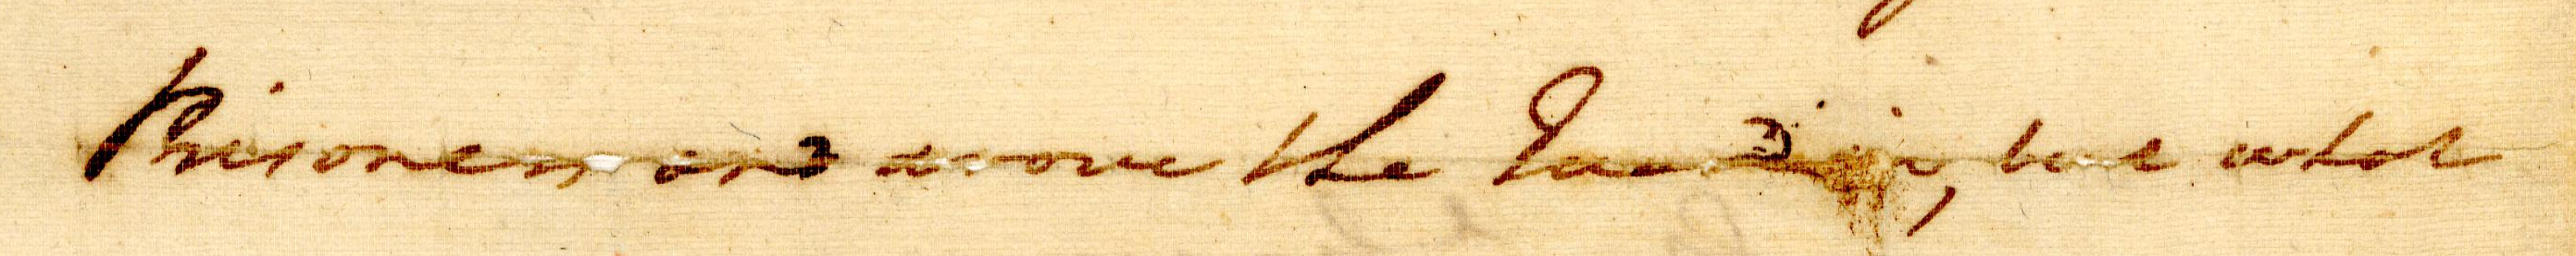Prisoners and drove the [_______], but what
